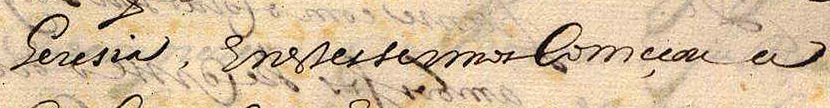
heresia, E nestes termos Começou a
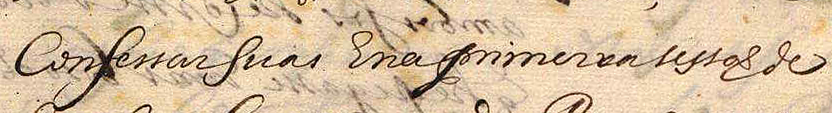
Confessar suas E na primeira sessaõ de
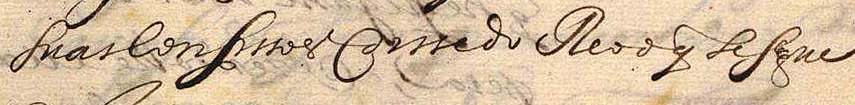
suas confissoes disse do Reo o q̄ se segue
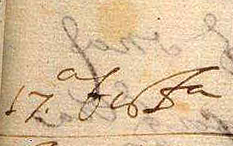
17.a testa
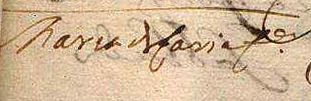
Maria de faria ta.
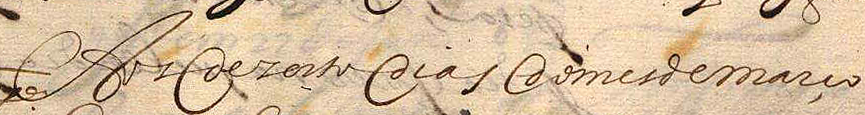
Aos dezoito dias do mes de março
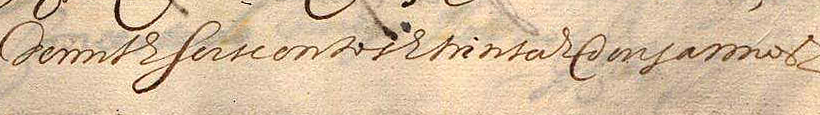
de mil E seiscentos E trinta E dous annos
